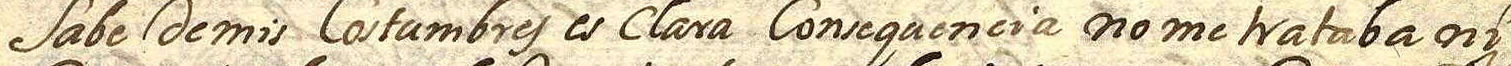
Sabe de mis Costumbres es clara Consequencia no me trataba ni
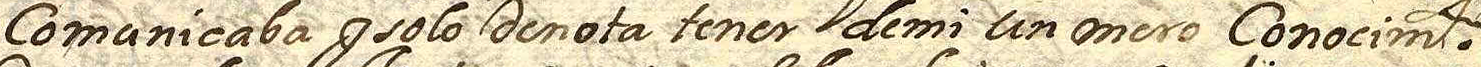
Comunicaba y solo denota tener demi un mero Conocim.to
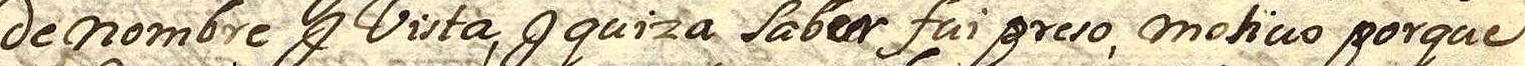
de nombre y Vista, y quiza saber fui preso, motiuo porque
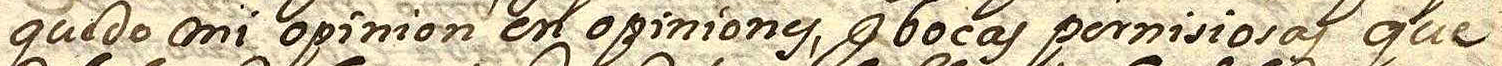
quedo mi opinion en opiniones, y bocas pernisiosas que
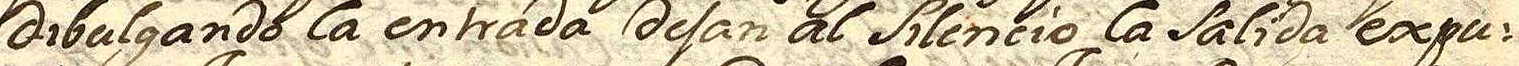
dibulgando la entrada dejan al silencio la salida expu
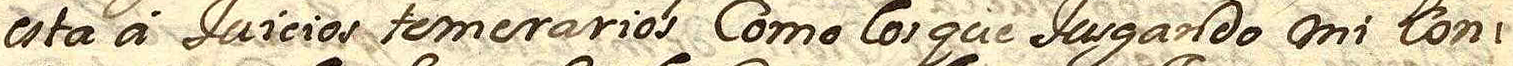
esta á Juicios temerarios Como los que Jusgando mi con
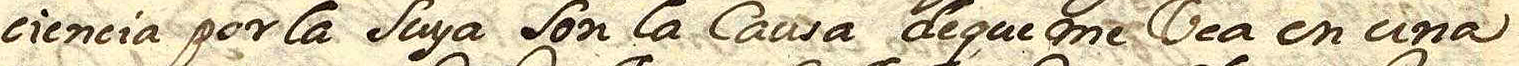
ciencia por la suya son la Causa de que me Vea en una
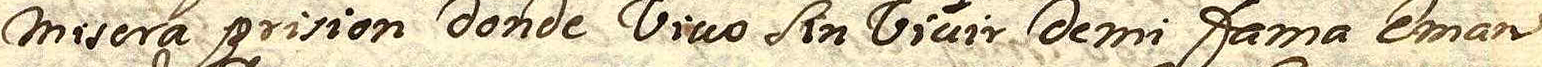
misera prision donde Viuo sin Viuir de mi fama ēman
